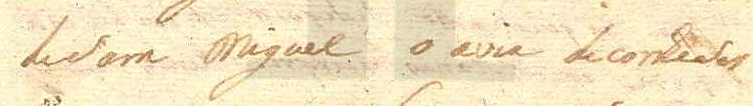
de Sam Miguel o avia de conheser
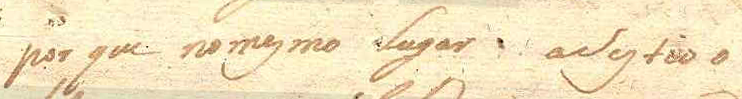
porque no mesmo lugar. asistio o
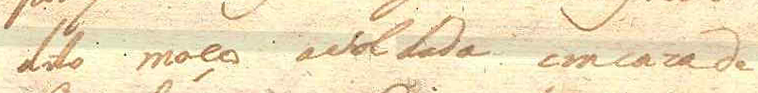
dito moço o soldado em caza de
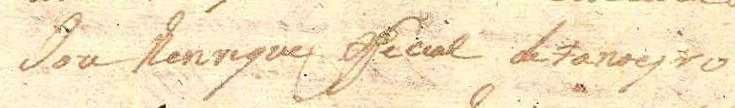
Ioze Henriques Official de tanoejro
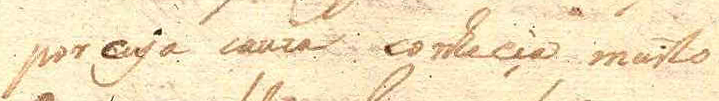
por cuja cauza conhecia muito
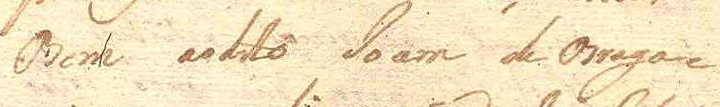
Bem ao dito Ioam de Braga e
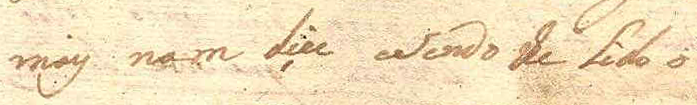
mais nam dice e sendo lhe lido o
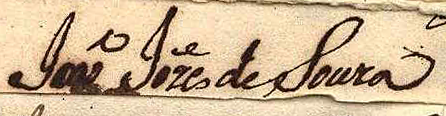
Ioaõ Iozé de Souza
